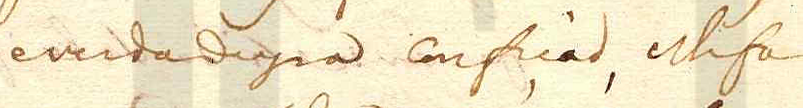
e verdadeyra confiçaõ, e lhe fa
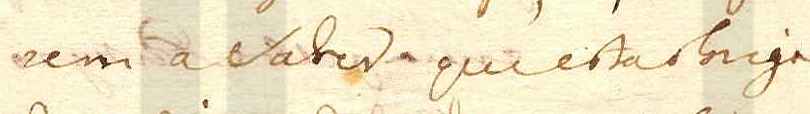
zem a saber que esta obriga
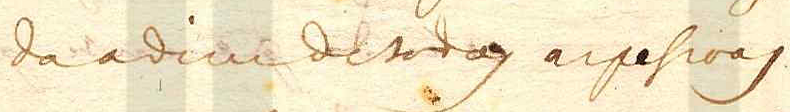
da a dizer de todas as pessoas
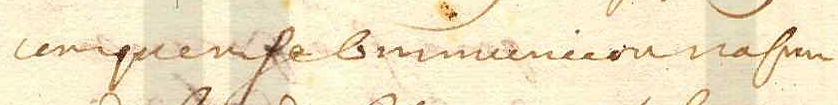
com quem se communicou na Cren
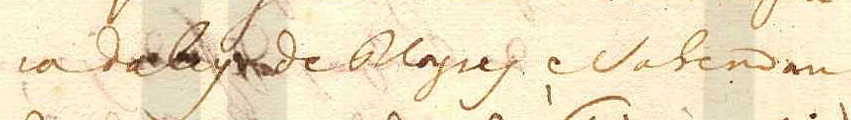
ça da ley de Moyzes, e sabem an
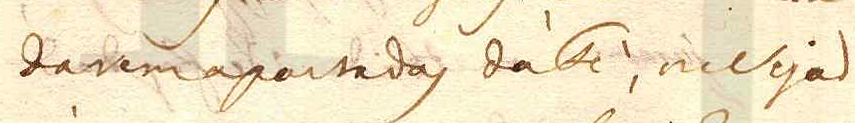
darem apartadas da Fé, ou sejaõ
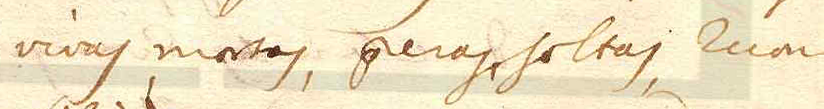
vivas mortas, prezas, soltas, Recon
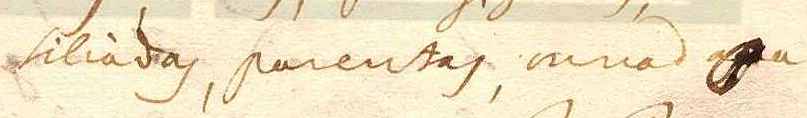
siliadas, parentas ou naõ pa
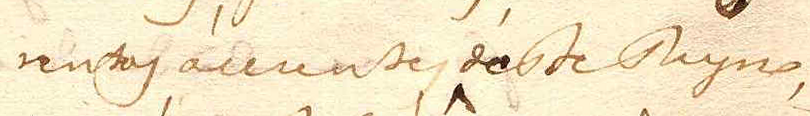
rentas, auzentes deste Reyno,
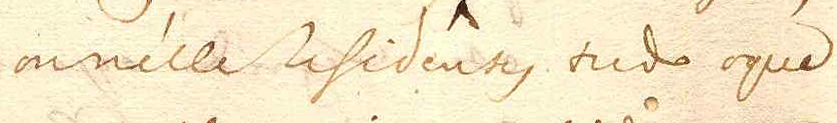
ou nelle Residentes tudo o que
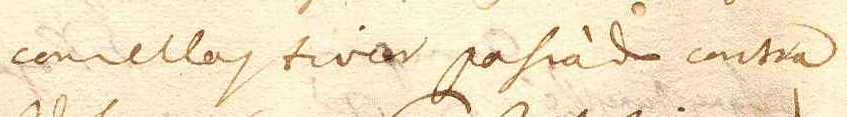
com ellas tiver passádo contra
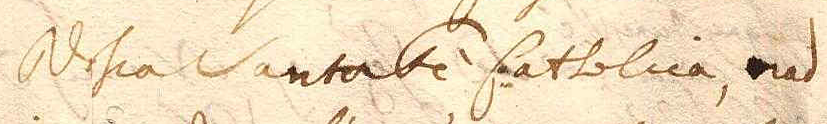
Nossa Santa Fé Catholica, naõ
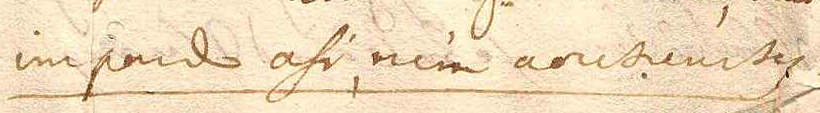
impondo a si, nem a outrem tes
